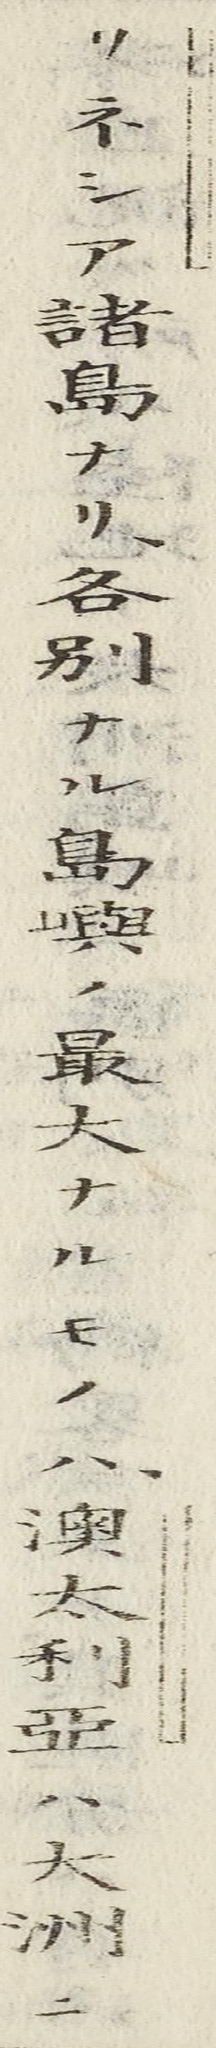リネシア諸島ナリ、各別ナル島嶼ノ最大ナルモノハ、澳太利亜ハ大洲ニ
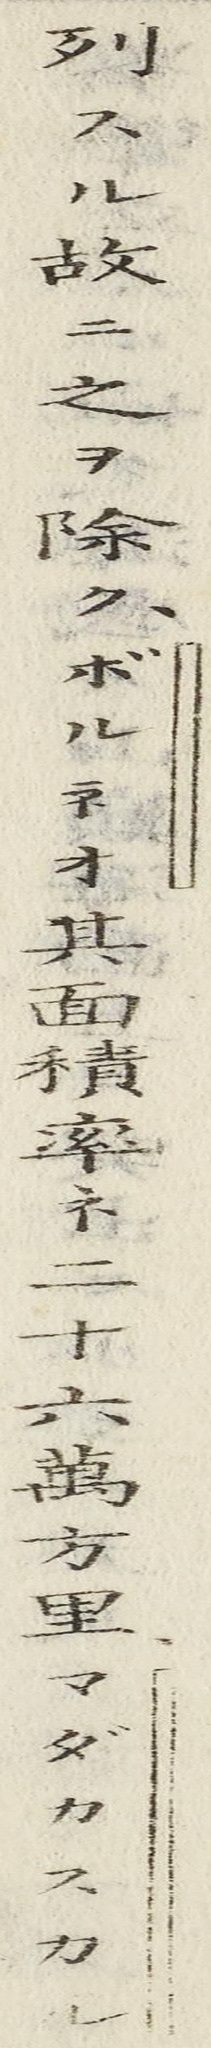列スル故ニ之ヲ除ク、ボルネオ其面積率ネ二十六万方里、マダカスカル
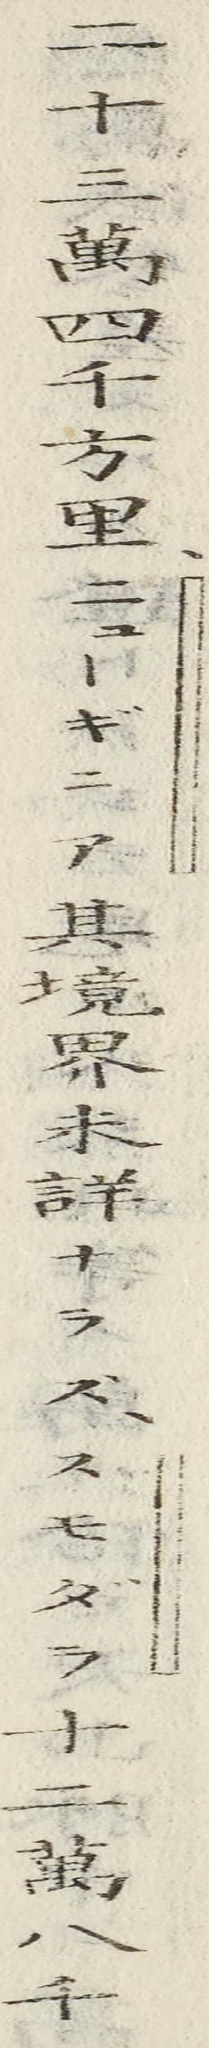二十三万四千方里、ニューギニア其境界未詳ナラズ、スモダラ十二万八千
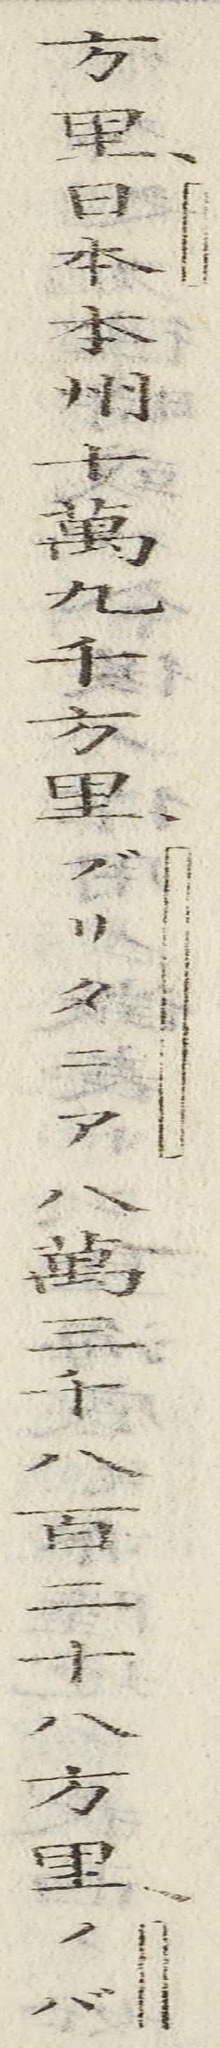方里、日本本州十万九千方里、ブリタニア八万三千八百二十八方里、ノバ
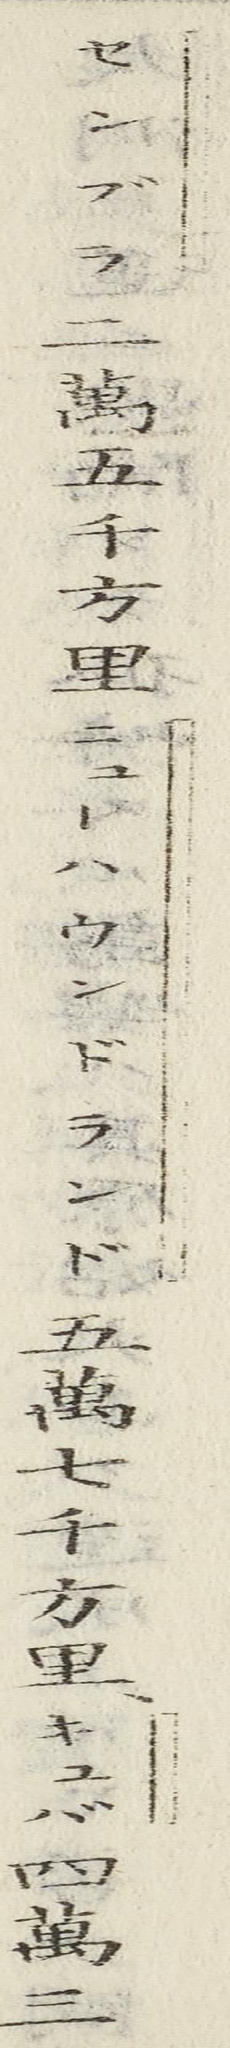センブラ二万五千方里、ニューハウンドランド五万七千方里、キュバ四万三
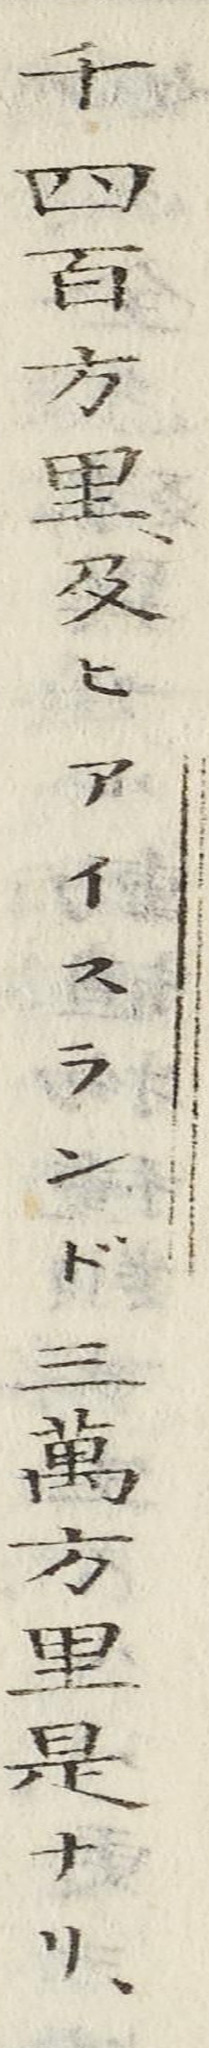千四百方里、及ヒアイスランド三万方里是ナリ、
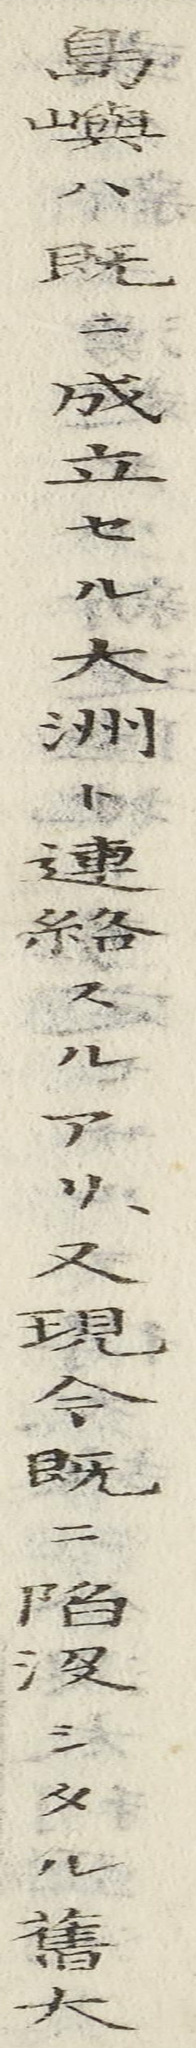島嶼ハ既ニ成立セル大洲ト連絡スルアリ、又現今既ニ陥没シタル旧大
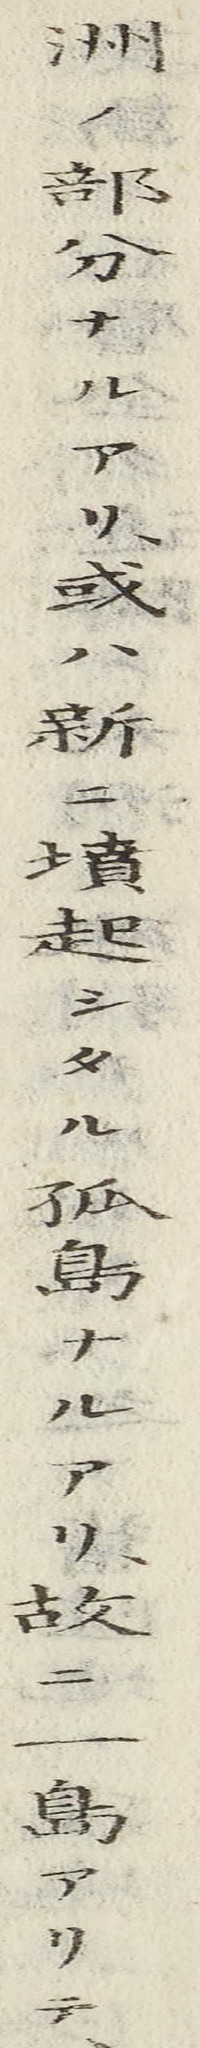洲ノ部分ナルアリ、或ハ新ニ墳起シタル孤島ナルアリ、故ニ一島アリテ、
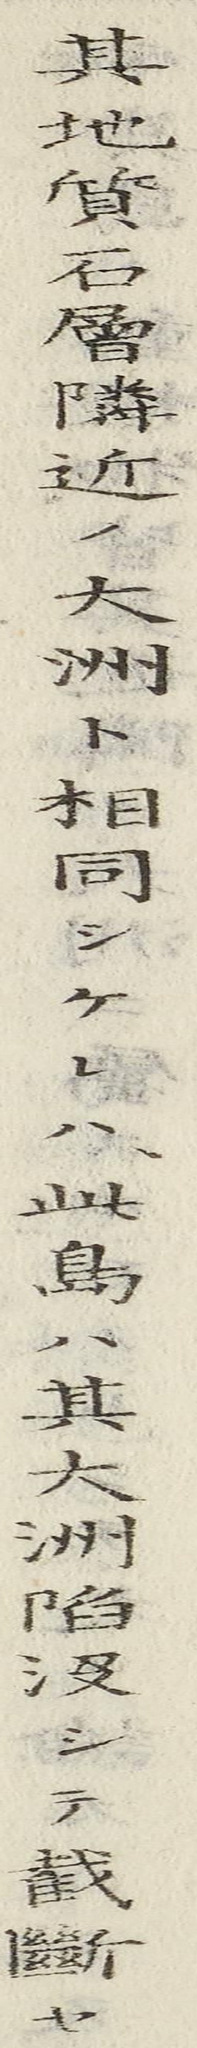其地質石層隣近ノ大洲ト相同シケレハ、此島ハ其大洲陥没シ截断セ
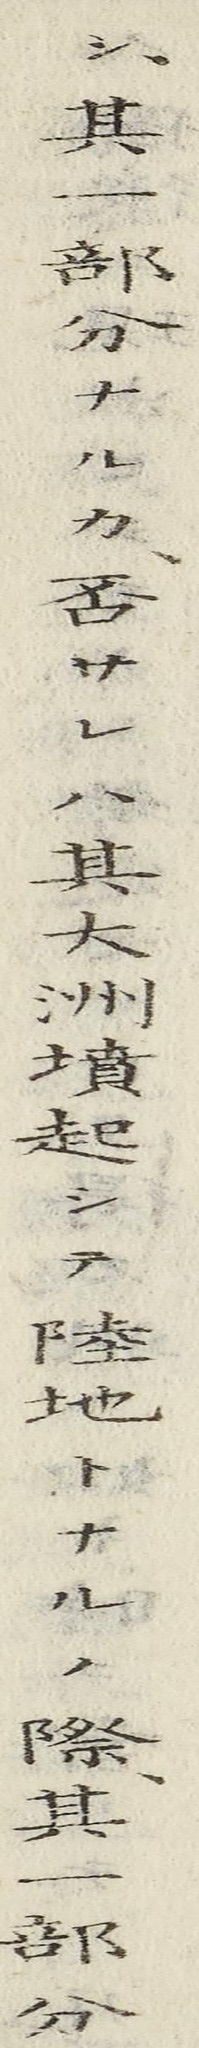シ、其一部分ナルカ、否サレハ其大洲墳起シテ陸地トナルノ際、其一部分

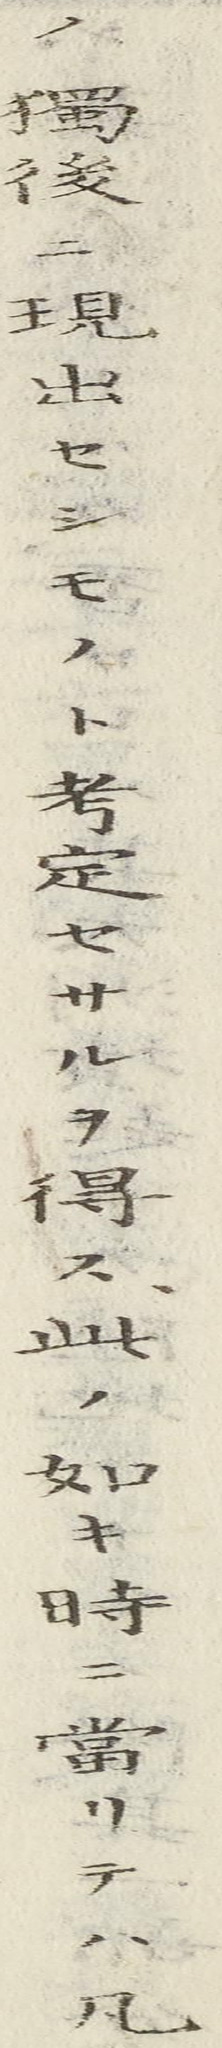ノ独後ニ現出セシモノト考定セサルヲ得ス、此ノ如キ時ニ当リテハ凡
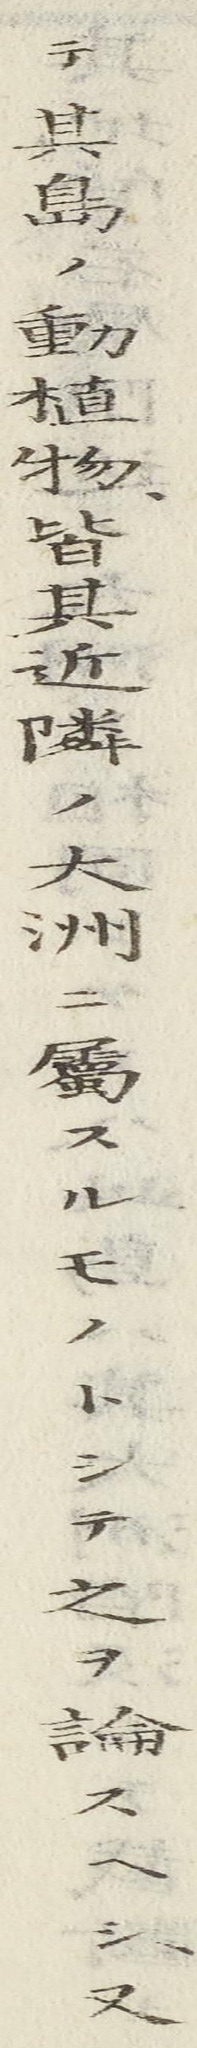テ其島ノ動植物、皆其近隣ノ大洲ニ属スルモノトシテ之ヲ論スヘシ、又
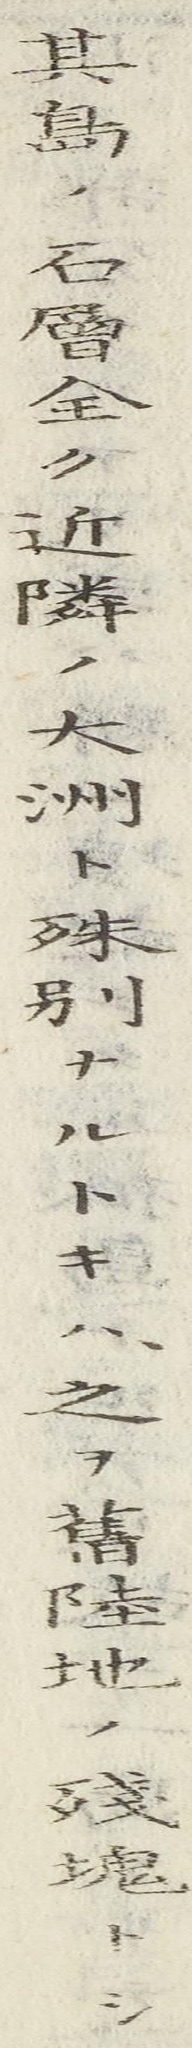其島ノ石層全ク近隣ノ大洲ト殊別ナルトキハ、之ヲ旧陸地ノ残塊トシ
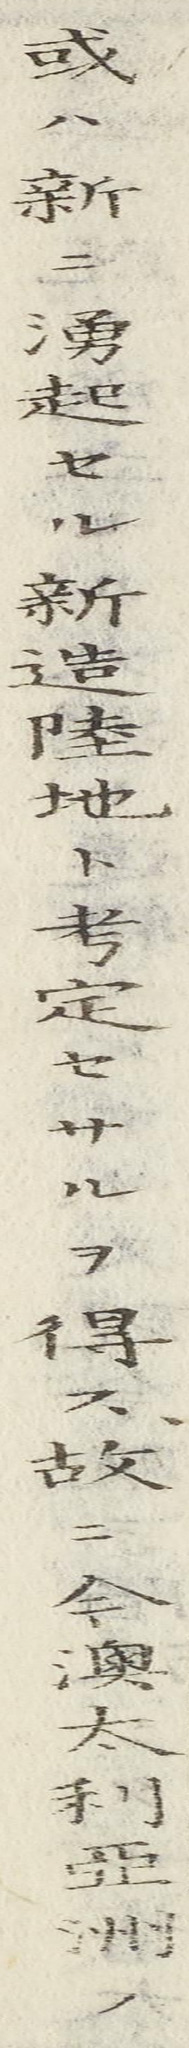或ハ新ニ湧起セル新造陸地ト考定セサルヲ得ス、故ニ今澳太利亜洲ノ
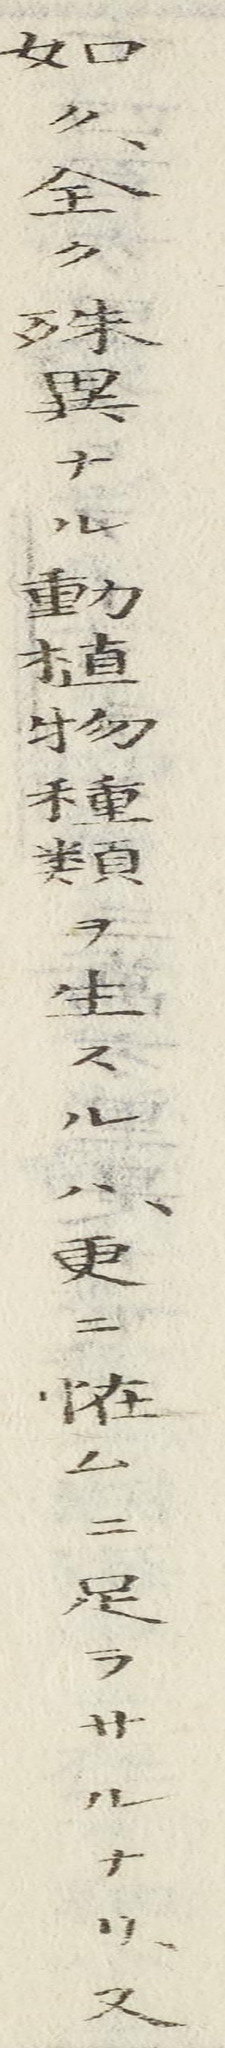如ク、全ク殊異ナル動植物ヲ生スルハ、更ニ恠ムニ足ラサルナリ、又
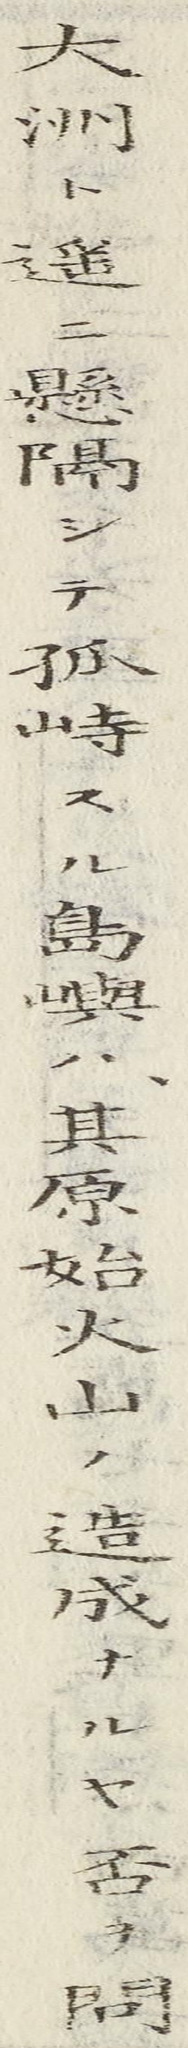大洲ト遥ニ懸隔シテ孤峙スル島嶼ハ、其原始火山ノ造成ナルヤ否ヲ問
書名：百科全書　地文學　全
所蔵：東京大学地震研究所図書室 Earthquake Research Institute Library, The University of Tokyo, JAPAN
